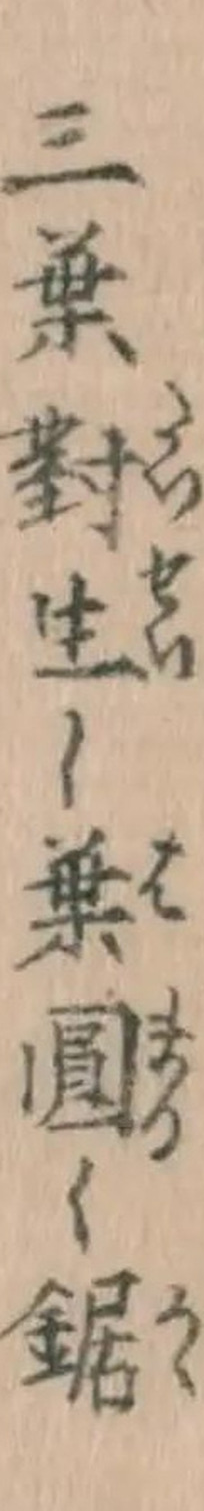三葉対生し葉円く鋸
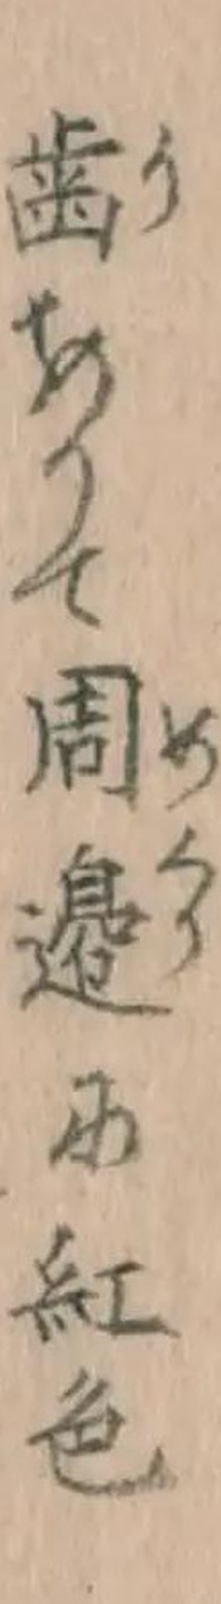歯ありて周辺に紅色
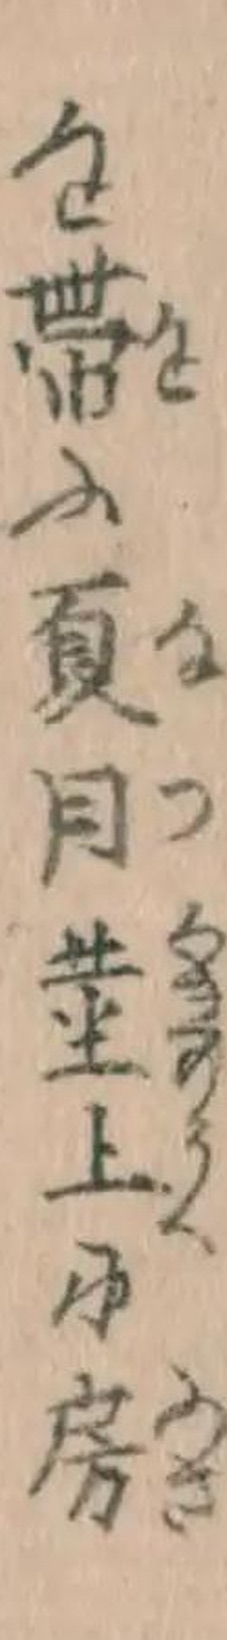を帯ふ夏月茎上に房
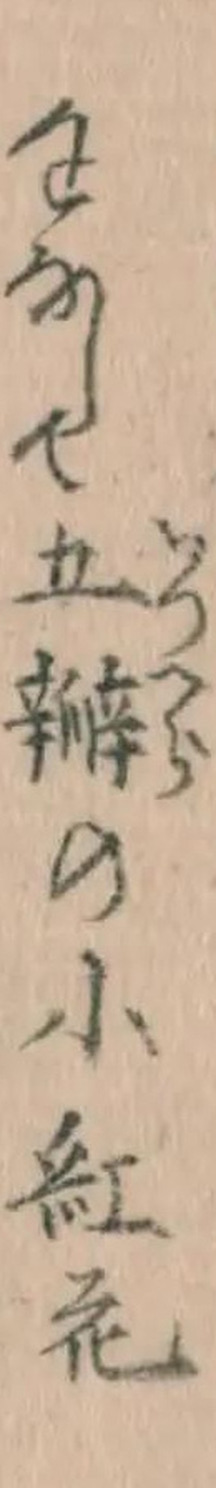をなして五弁の小紅花
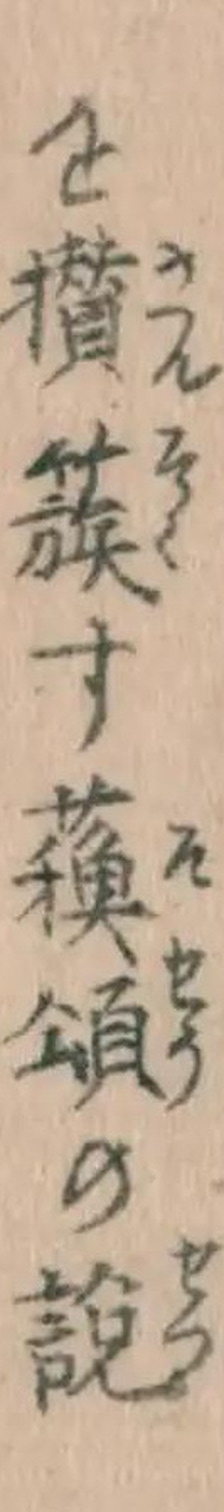を攢簇す蘇頌の説

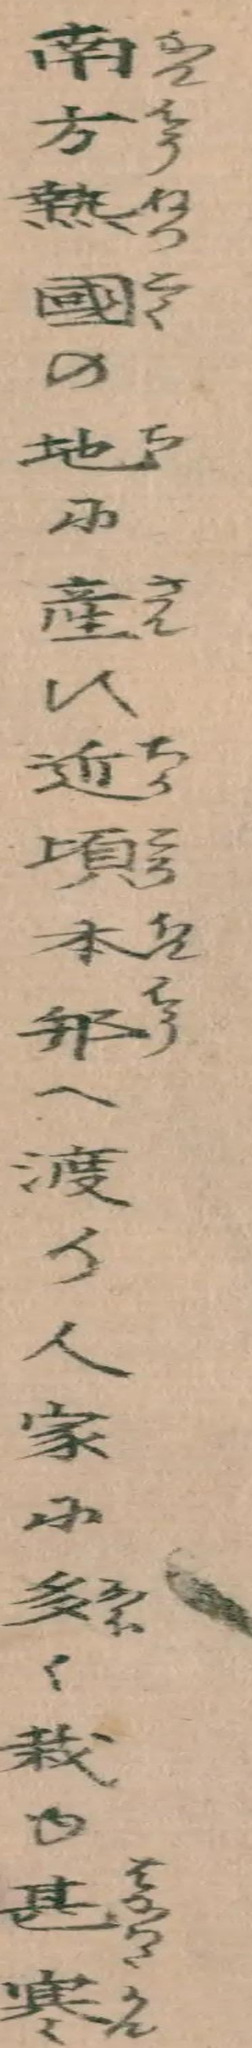南方熱国の地に産す近頃本邦へ渡り人家に多く栽ゆ甚寒
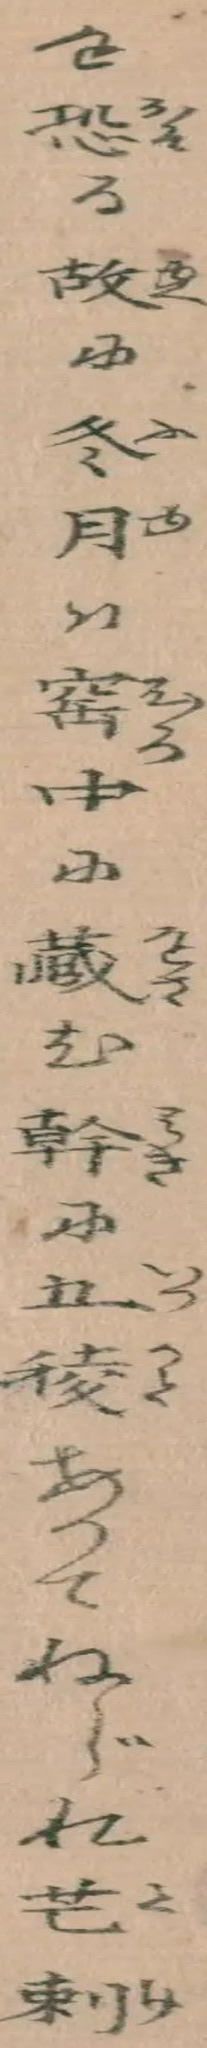を恐る故に冬月は窯中に蔵む幹に五稜ありてねじれ芒剌
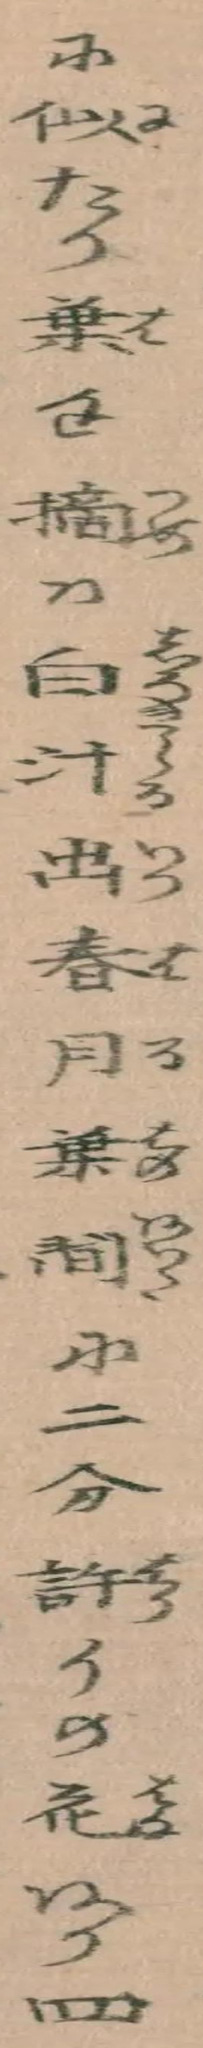に似たり葉を摘は白汁出春月葉間に二分許りの花あり四
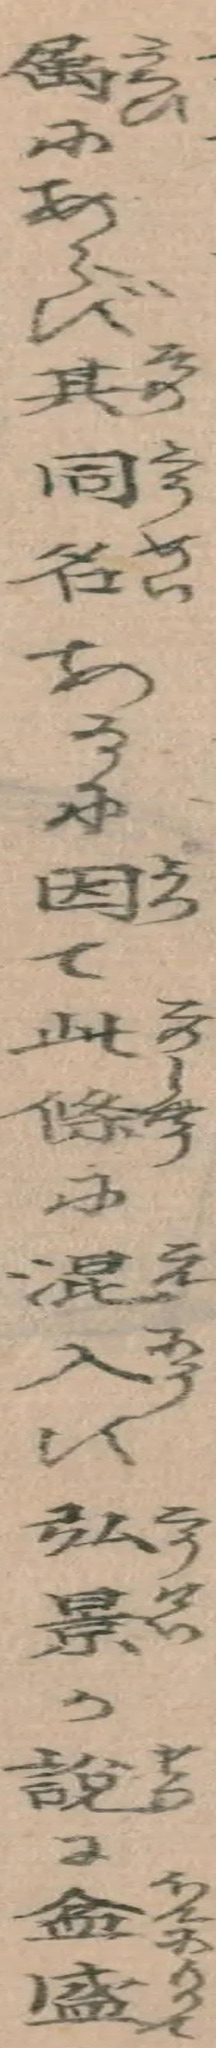属にあらず其同名あるに因て此条に混入す弘景か説に盆盛
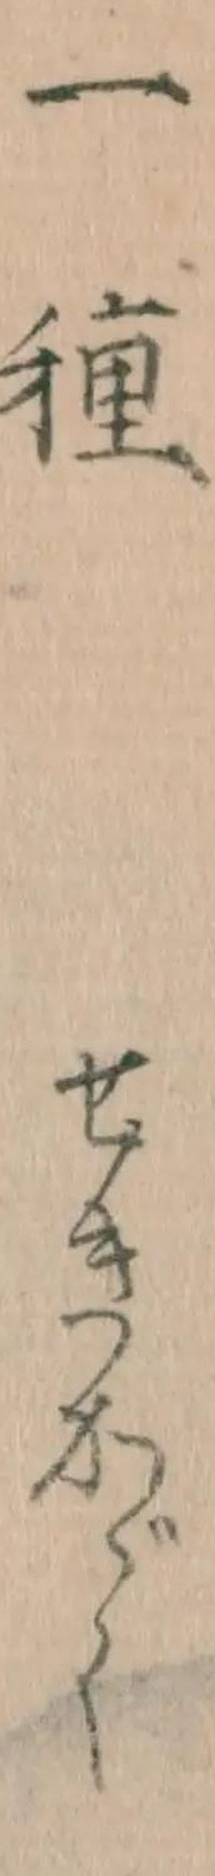一種せきかゞく
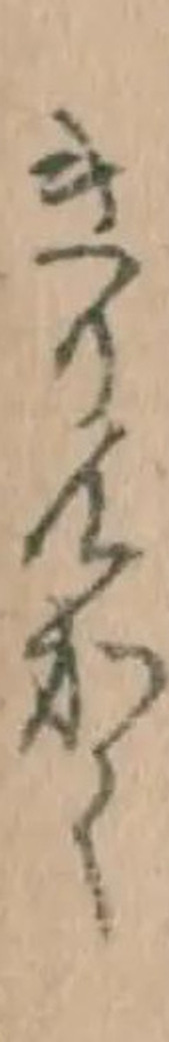きりんかく

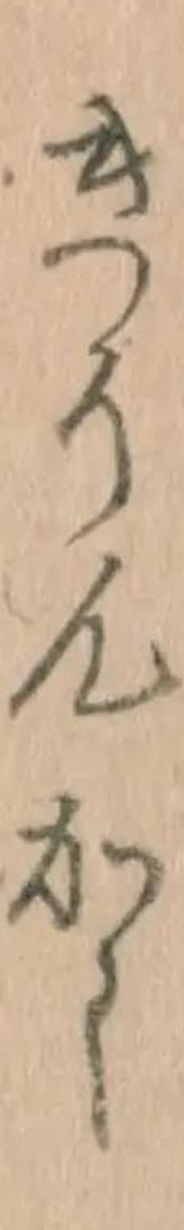きりんかし

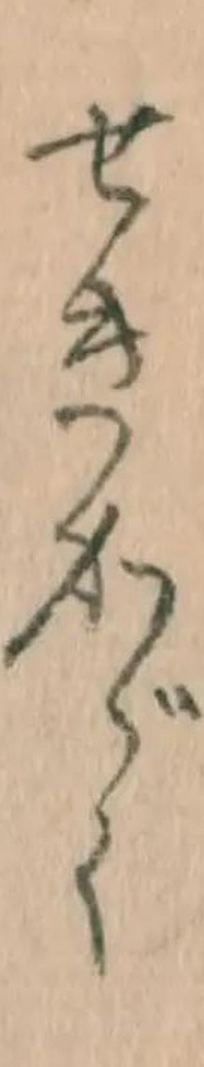せきかゞく

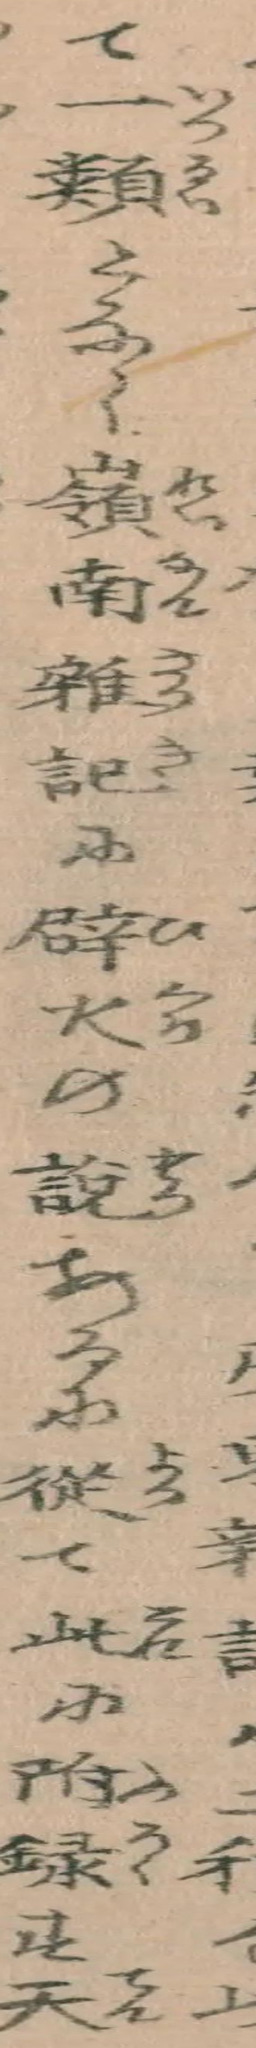て一類となし嶺南雑記に辟火の説あるに従て此に附録す天
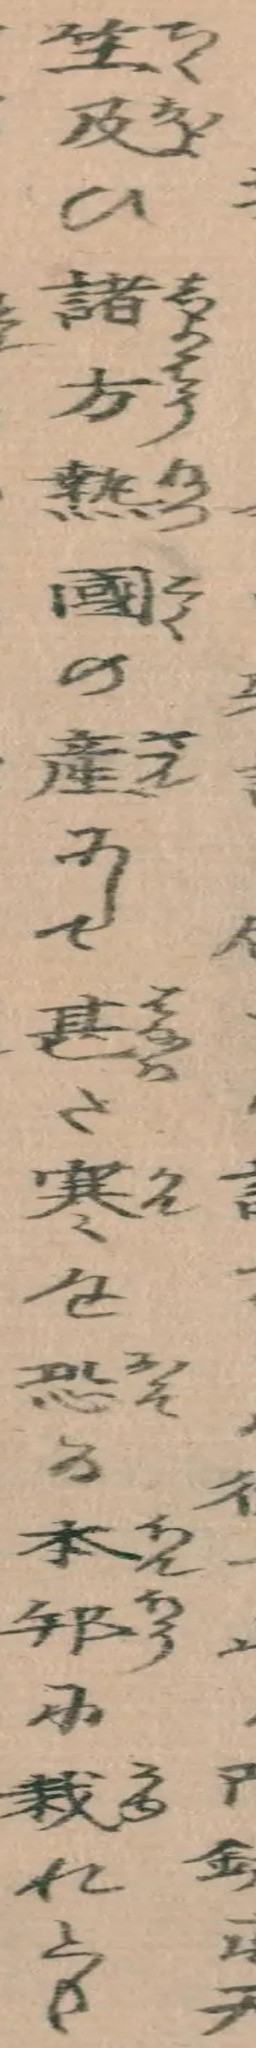竺及ひ諸方熱国の産にして甚た寒を恐る本邦に栽れとも
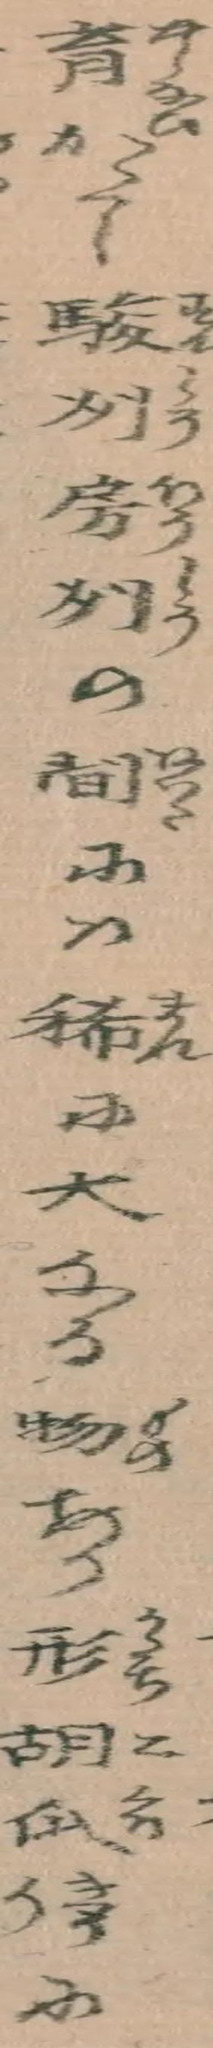育かたし駿州房州の間には稀に大なる物あり形胡瓜きうりに
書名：本草図譜. 巻34-36
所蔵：国立国会図書館 National Diet Library, JAPAN
